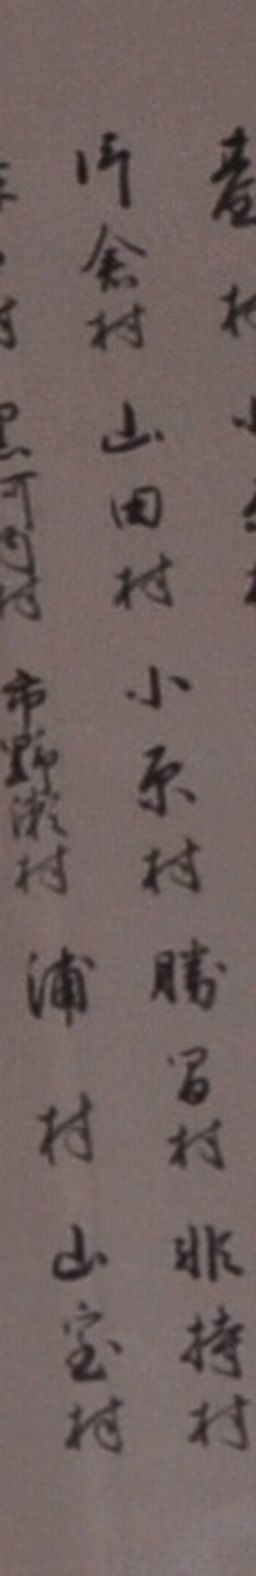溝口村黒河内村市野瀬村浦村山室村
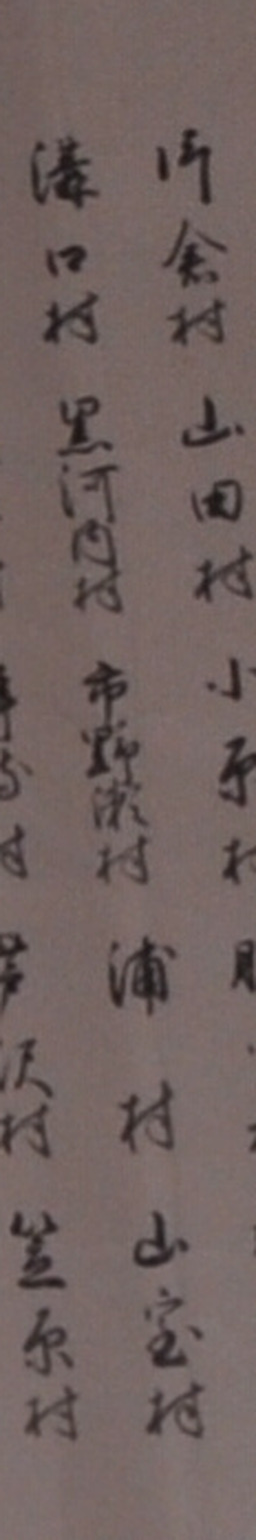溝口村黒河内村市野瀬村浦村山室村
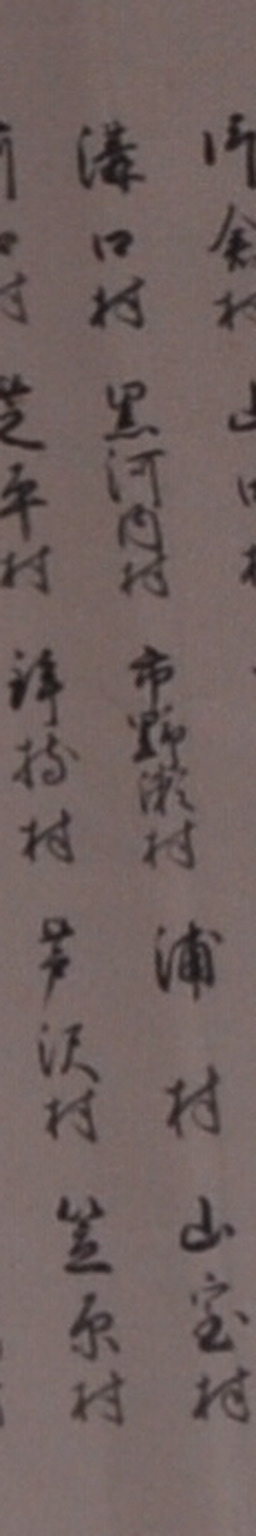荊口村芝平村鉾持村芦沢村笠原村
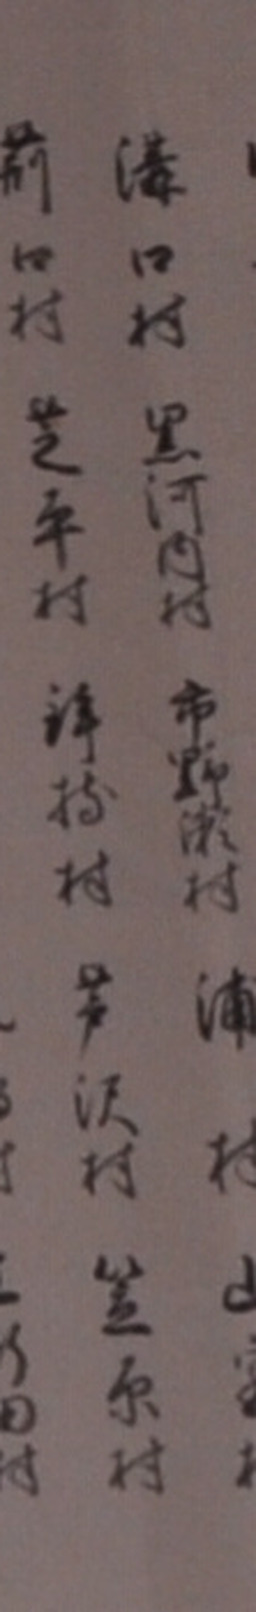荊口村芝平村鉾持村芦沢村笠原村
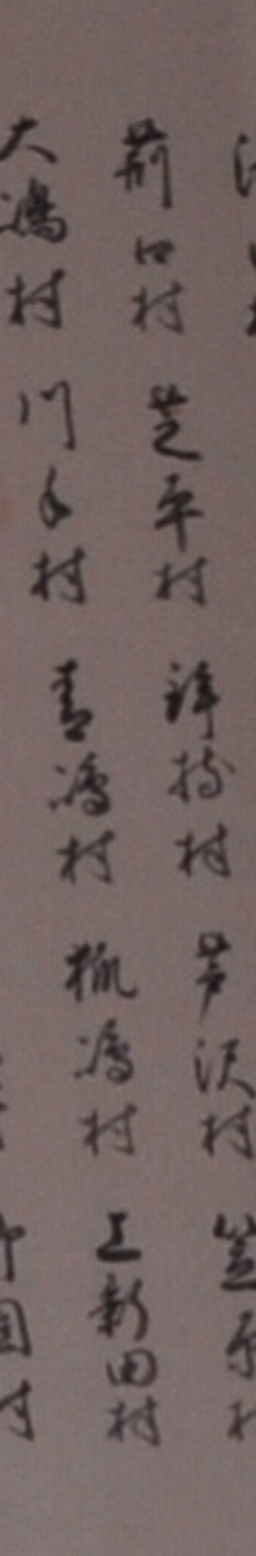大島村川手村青島村狐島村上新田村
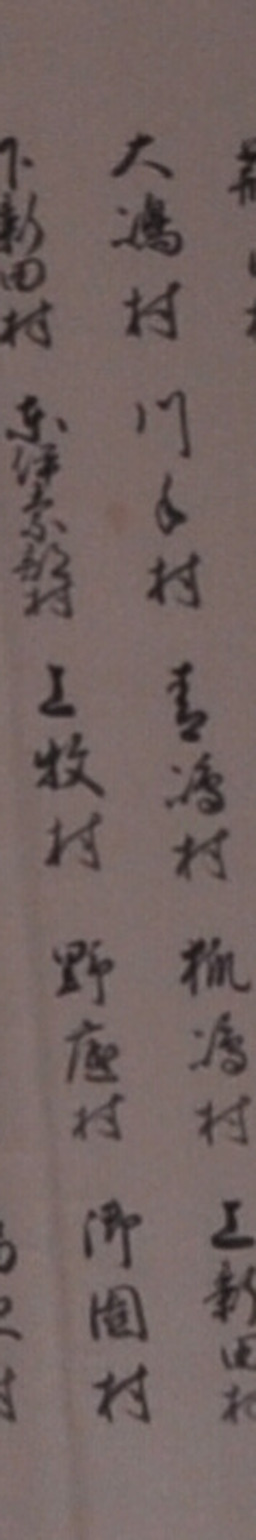下新田村東伊奈部村上牧村野底村御園村
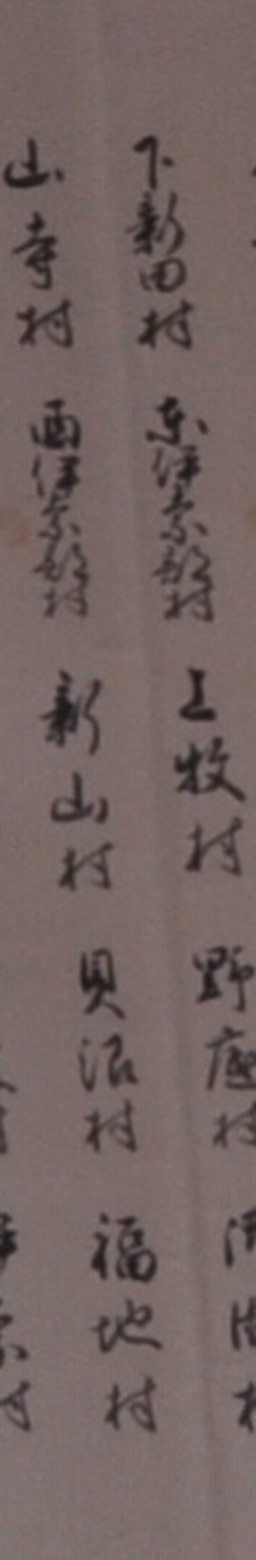山寺村西伊奈部村新山村貝沼村福地村
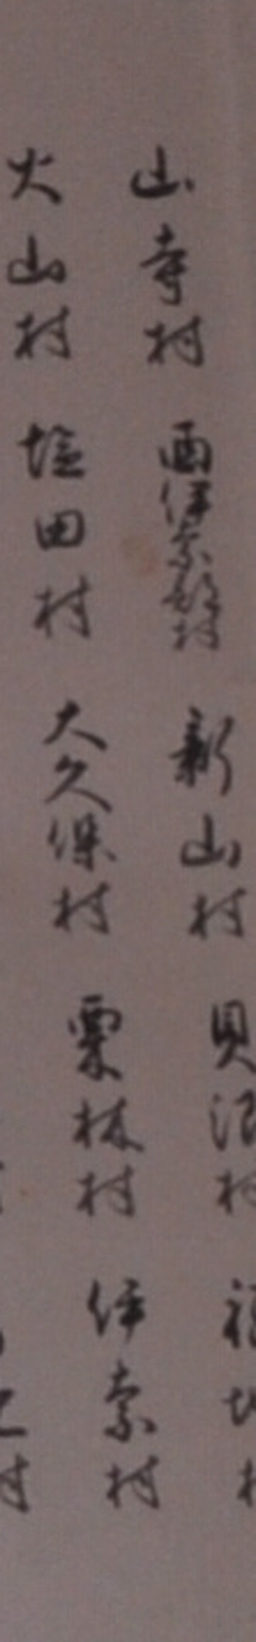火山村塩田村大久保村栗林村伊奈村
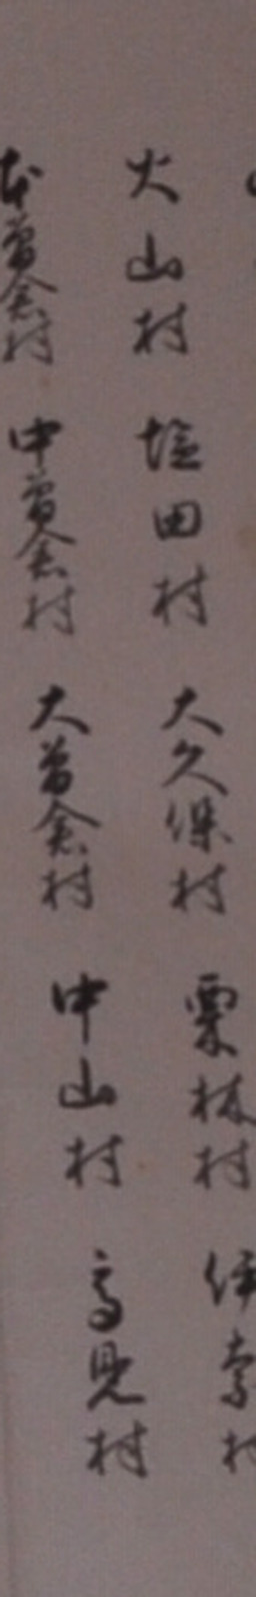本曽倉村中曽倉村大曽倉村中山村高見村
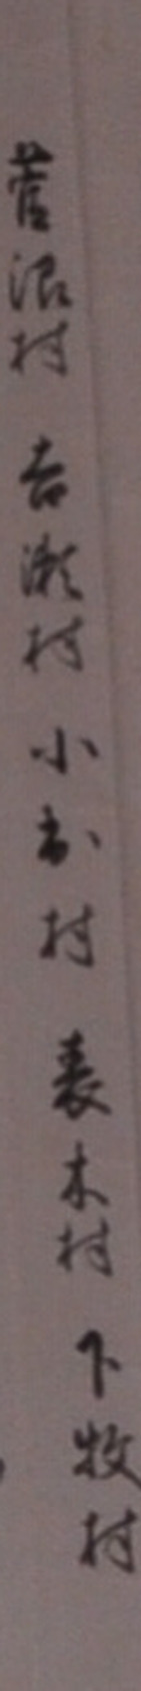菅沼村吉瀬村小出村表木村下牧村
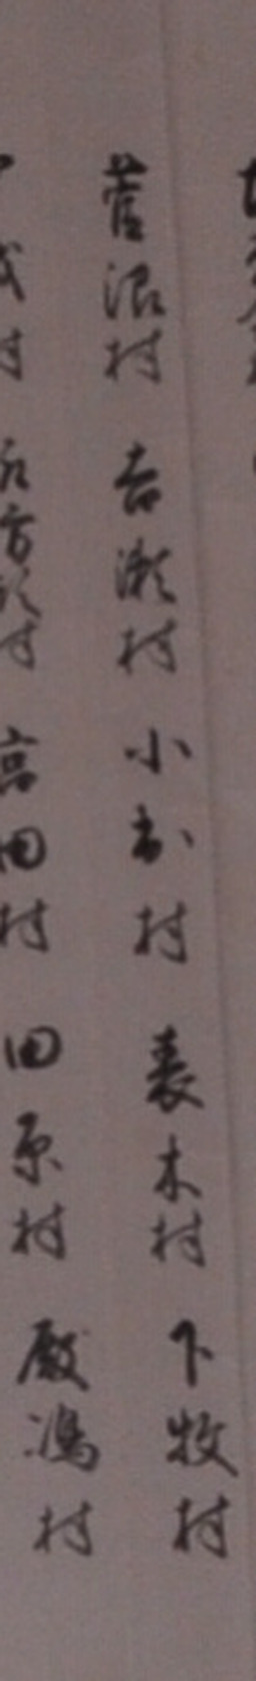中越村諏訪形村宮田村田原村殿島村
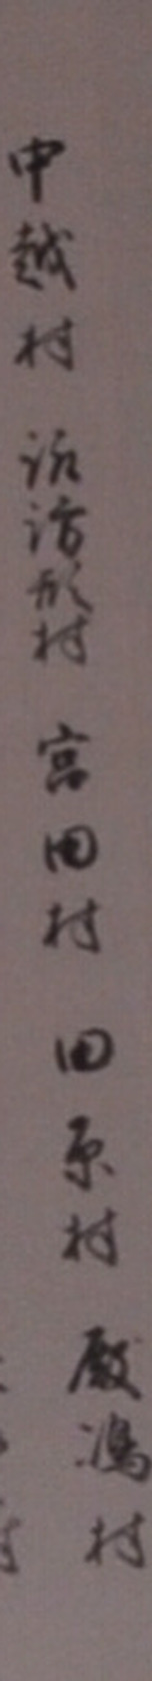中越村諏訪形村宮田村田原村殿島村
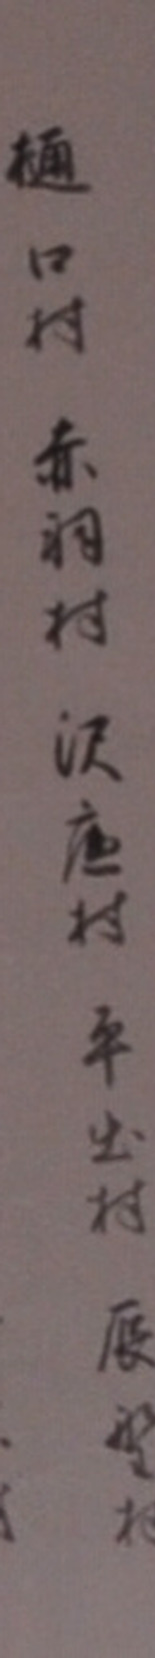樋口村赤羽村沢底村平出村辰野村
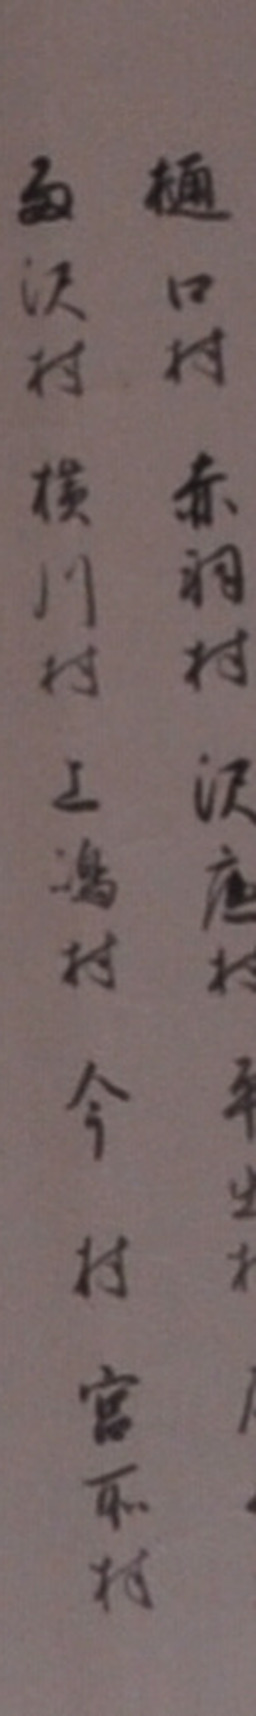雨沢村横川村上島村今村宮所村
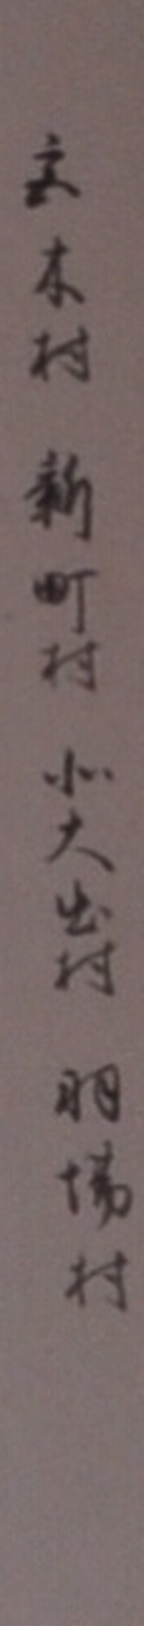宮木村新町村北大出村羽場村
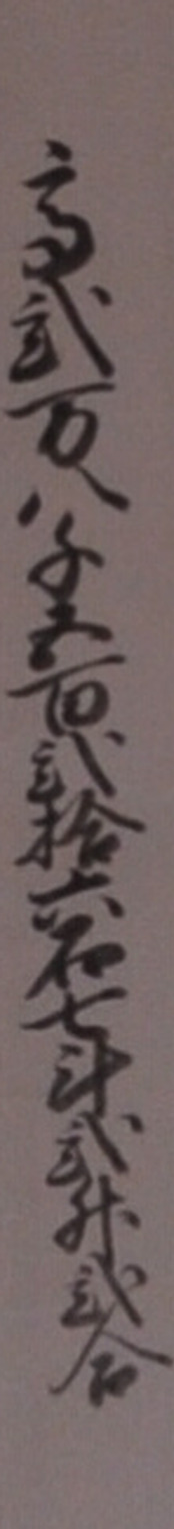高弐万八千五百弐拾六石七斗弐升弐合
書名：御朱印写・領地目録写
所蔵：伊那市立高遠町図書館・合同会社AMANE
